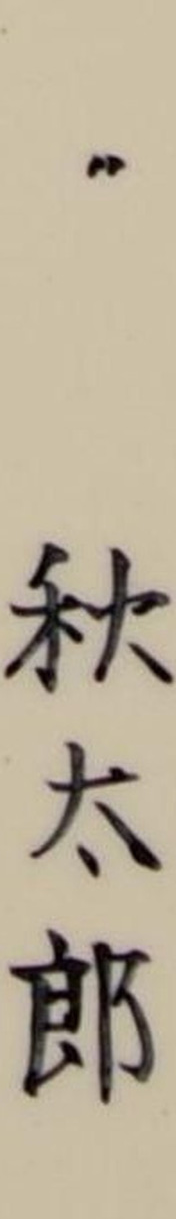秋太郎
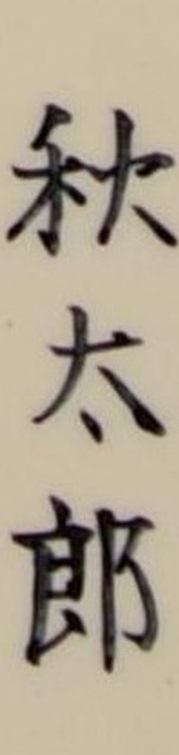秋太郎
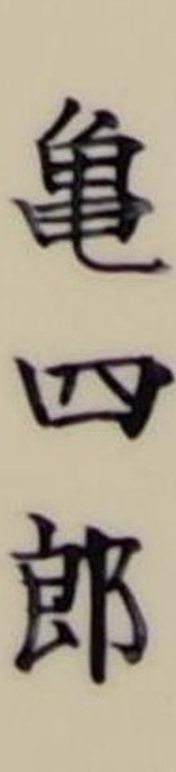亀四郎
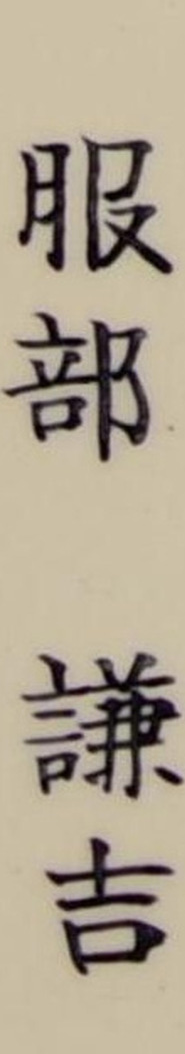服部謙吉
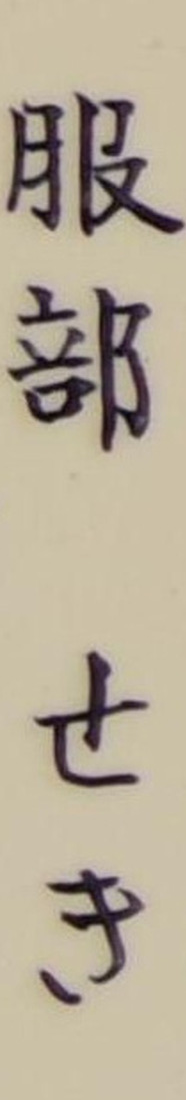服部せき
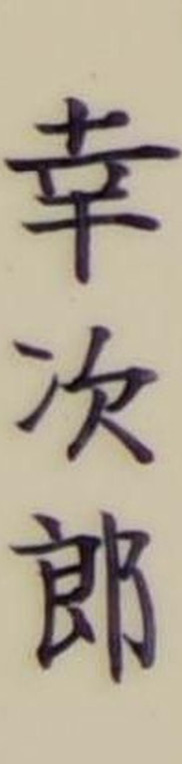幸次郎

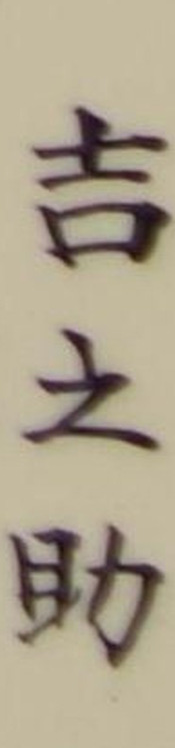吉之助
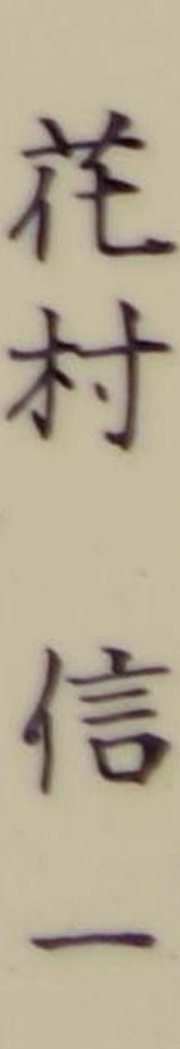花村信一
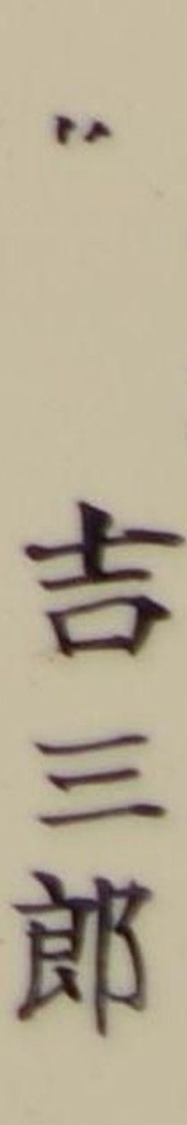吉三郎
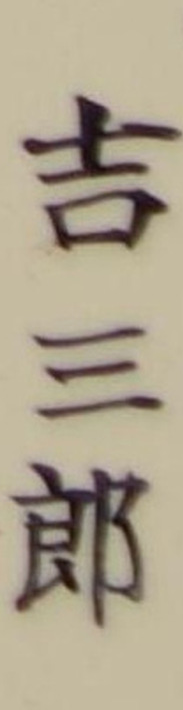吉三郎
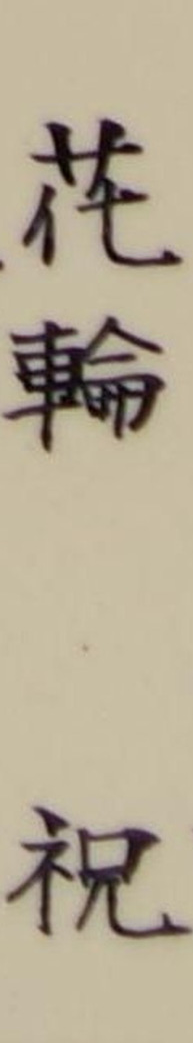花輪祝
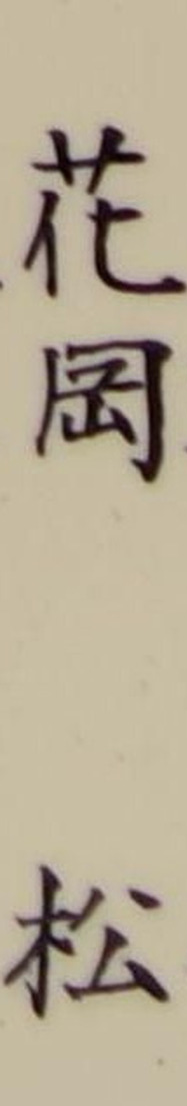花岡松
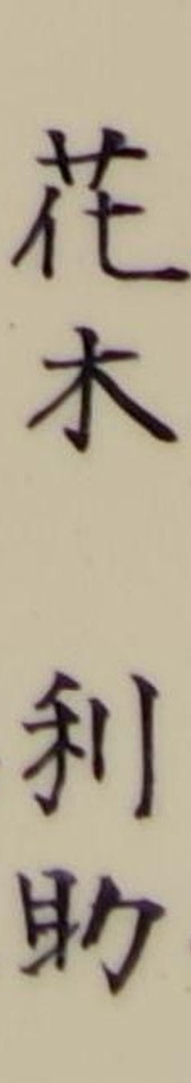花木利助
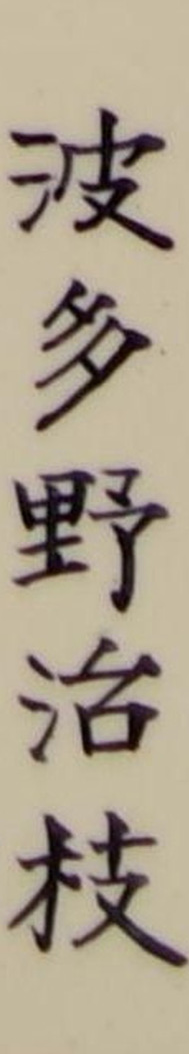波多野治枝
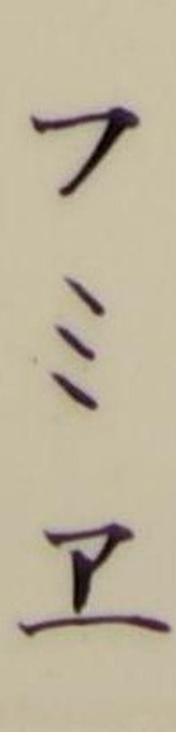フミヱ
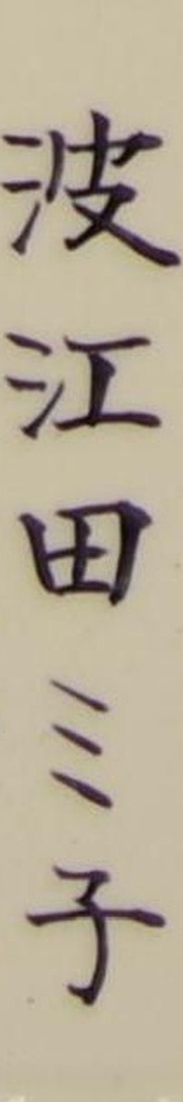波江田ミ子
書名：A~D
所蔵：koyasan kongobuji
